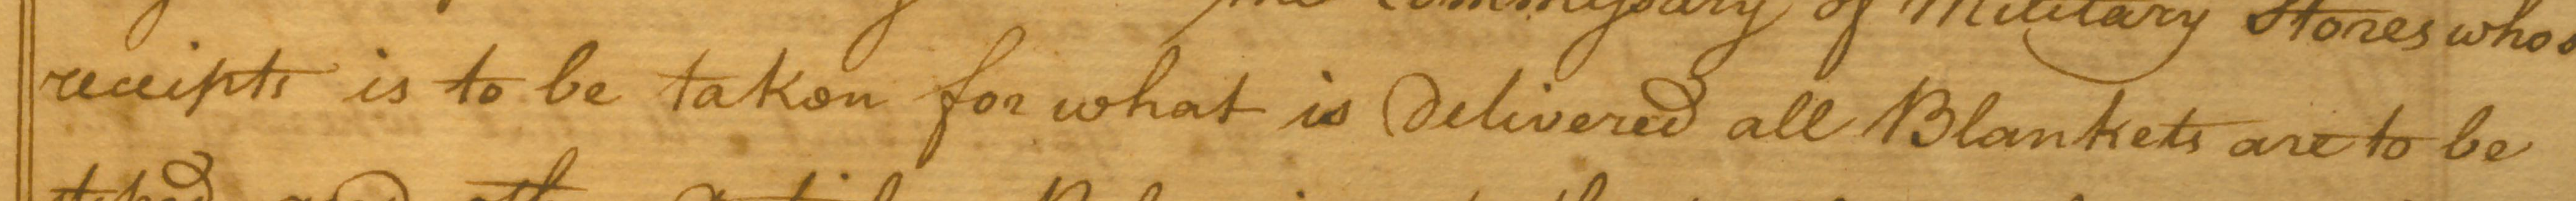receipts is to be taken for what is delivered all Blankets are to be
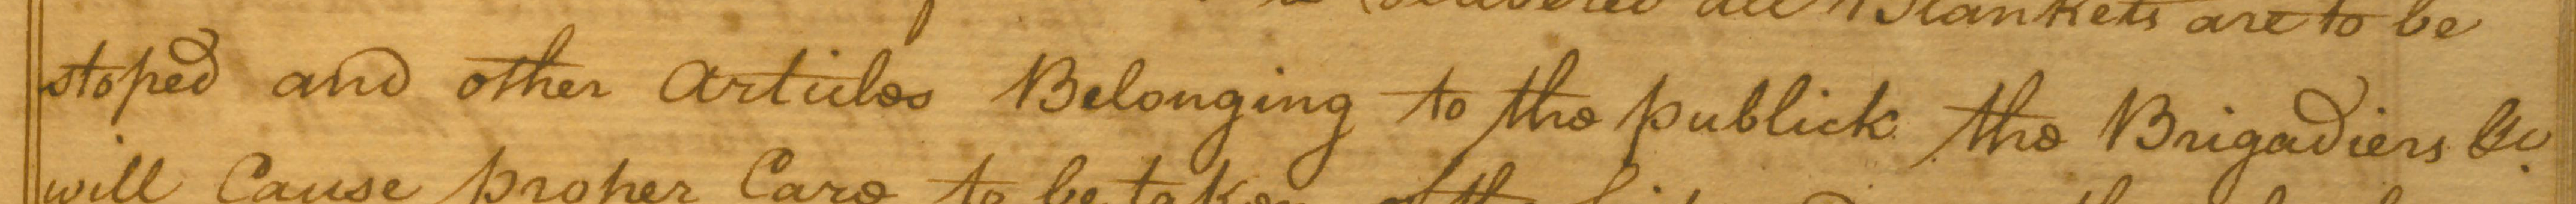stoped and other articles Belonging to the publick the Brigadiers &c.
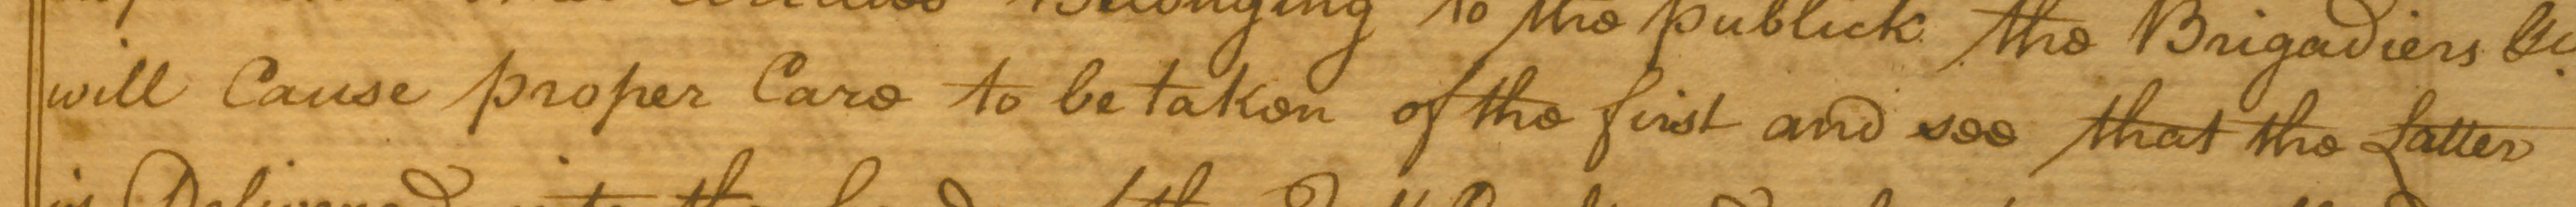will Cause proper Care to be taken of the first and see that the Latter
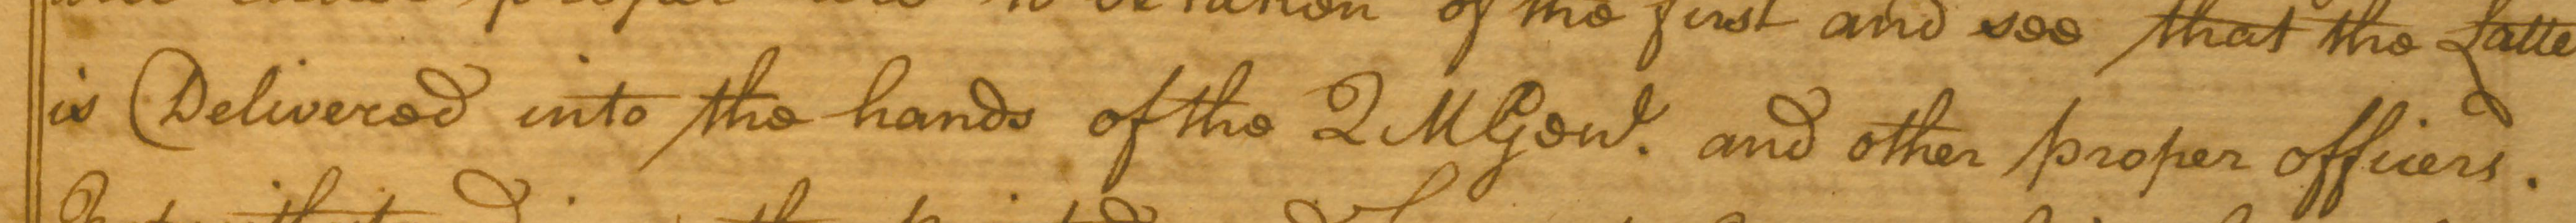is Delivered into the hands of the QMGen^l. and other proper officers.
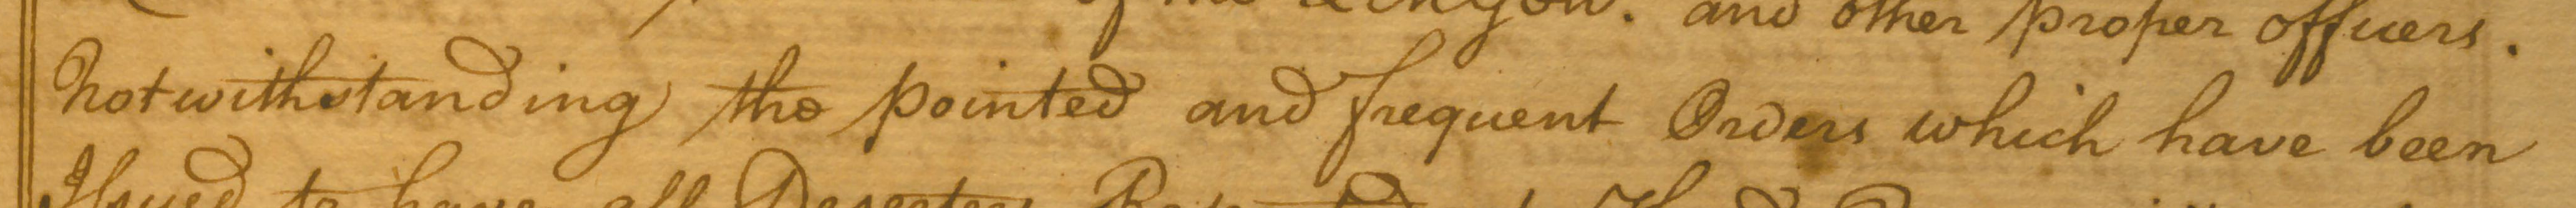notwithstanding the pointed and frequent Orders which have been
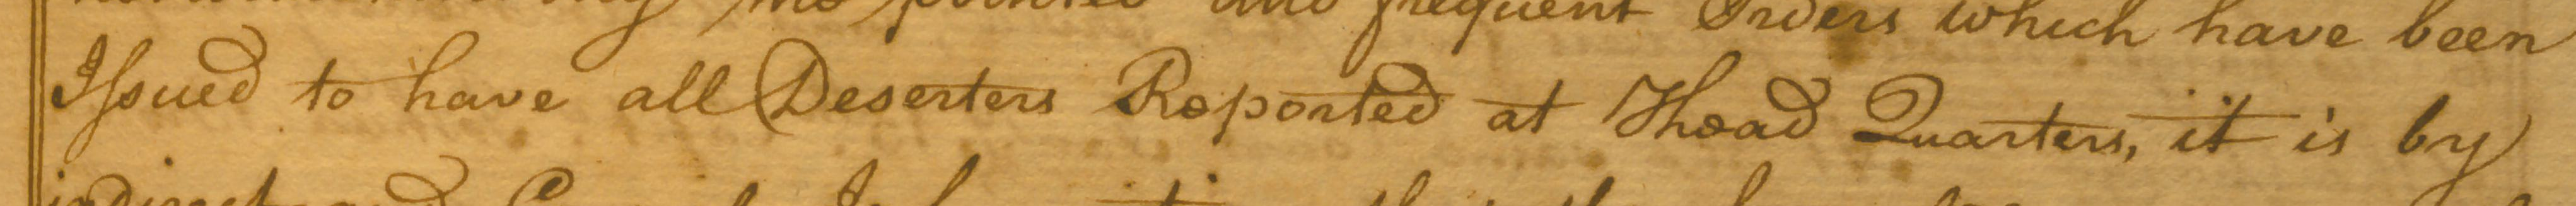Issued to have all Deserters Reported at Head Quarters, it is by
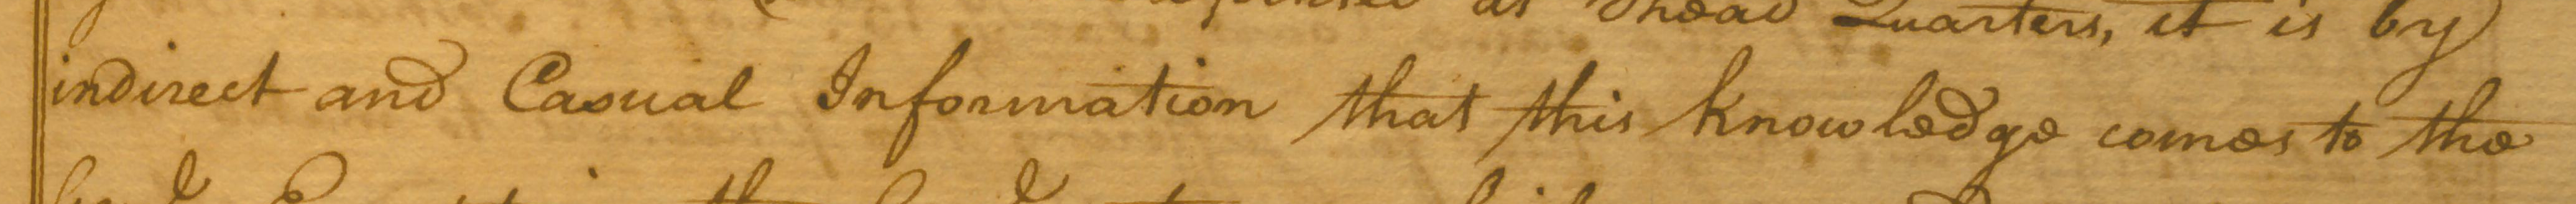indirect and Casual Information that this knowledge comes to the
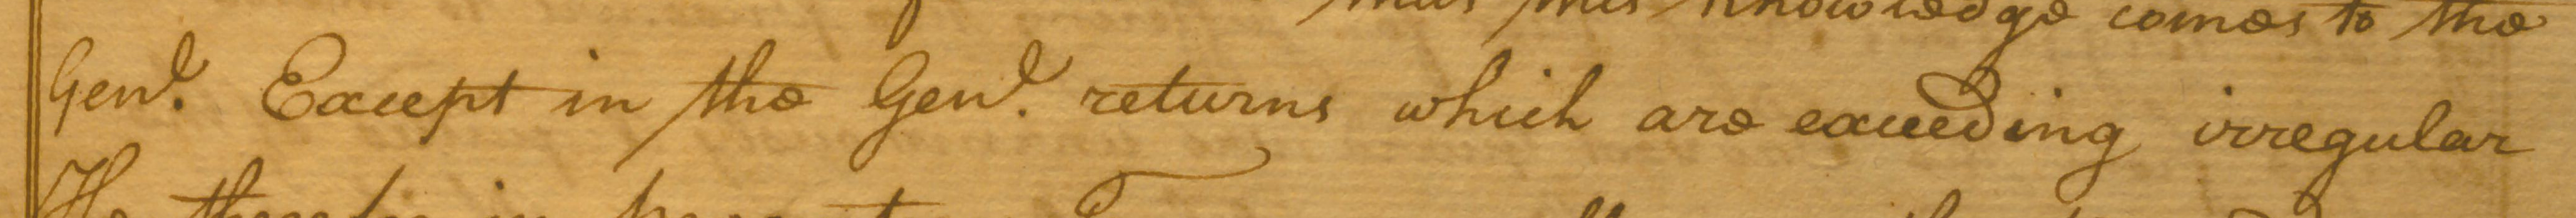Gen^l. Except in the Gen^l. returns which are exceeding irregular
